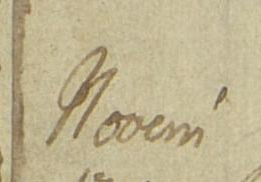Novem^r
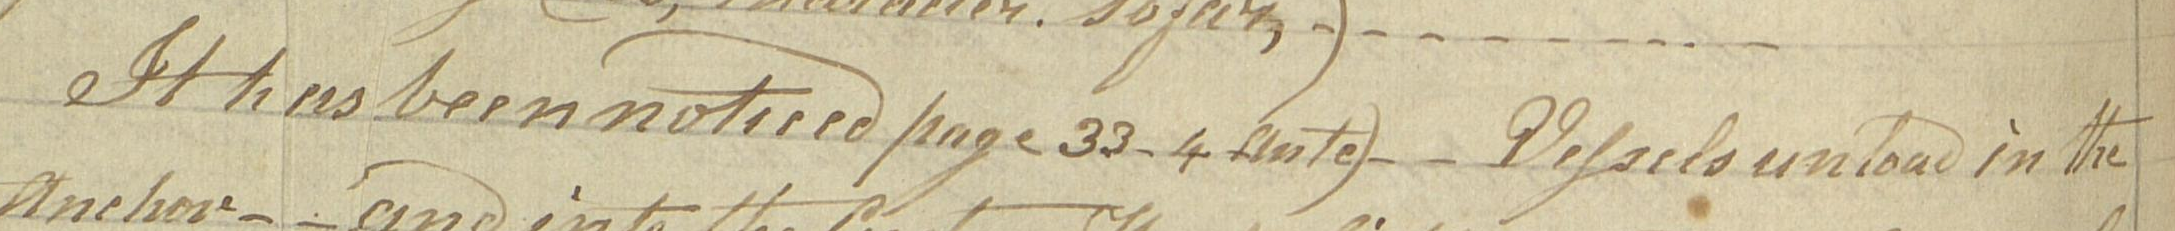It has been noticed page 33-4 Ante) Vessels unload in the
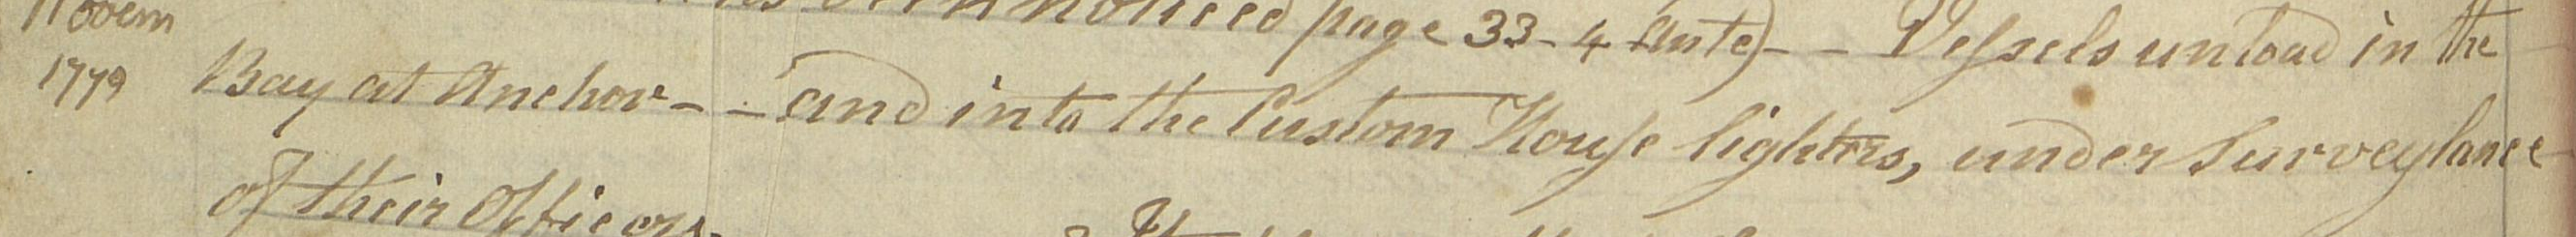1779 Bay at Anchor and into the Custom House lighters, under surveylance
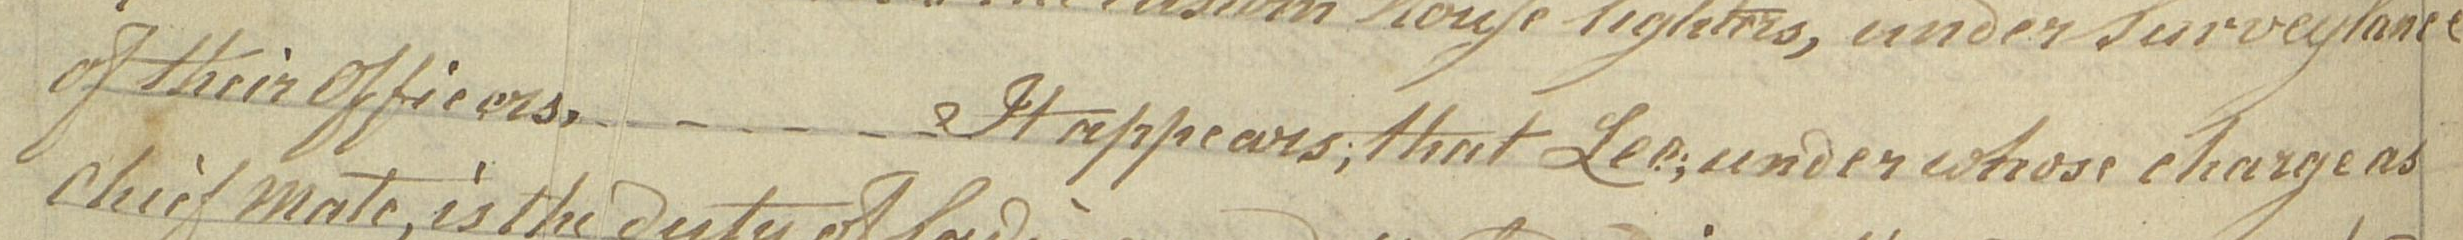of their Officers. It appears; that Lee; under whose charge as
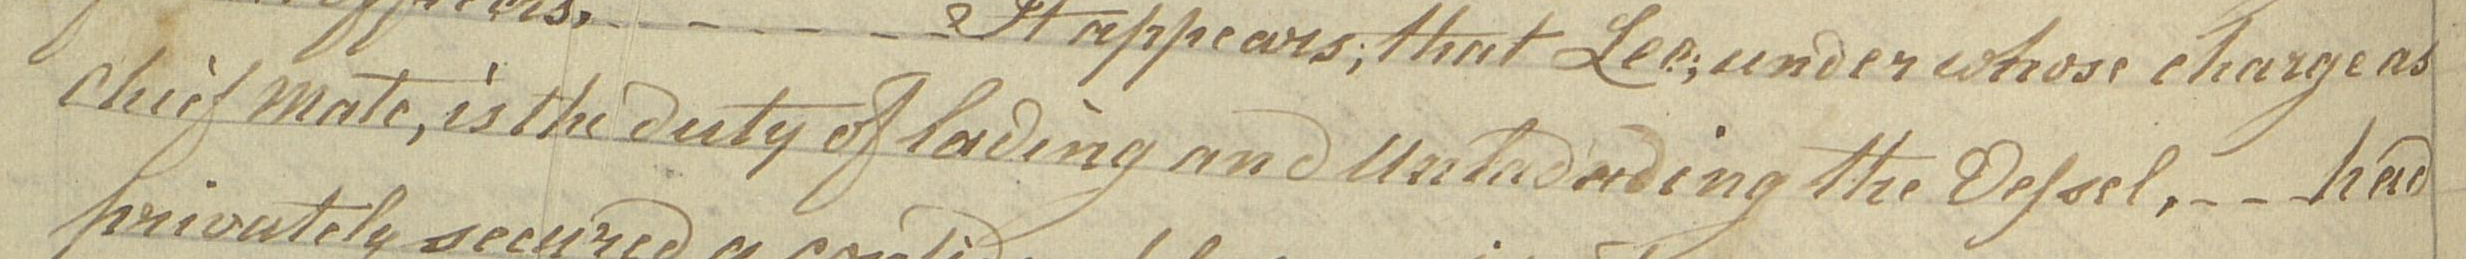chief mate, is the duty of laving and Unladnding the Vessel, had
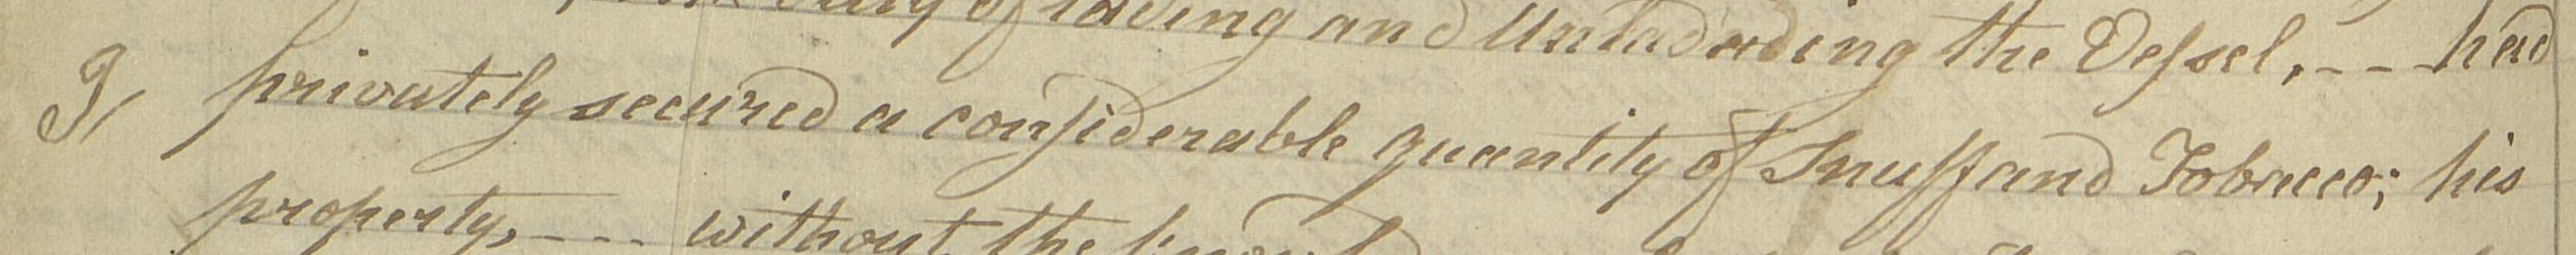J privately secured a considerable quantity of Snuff and Tobacco; his
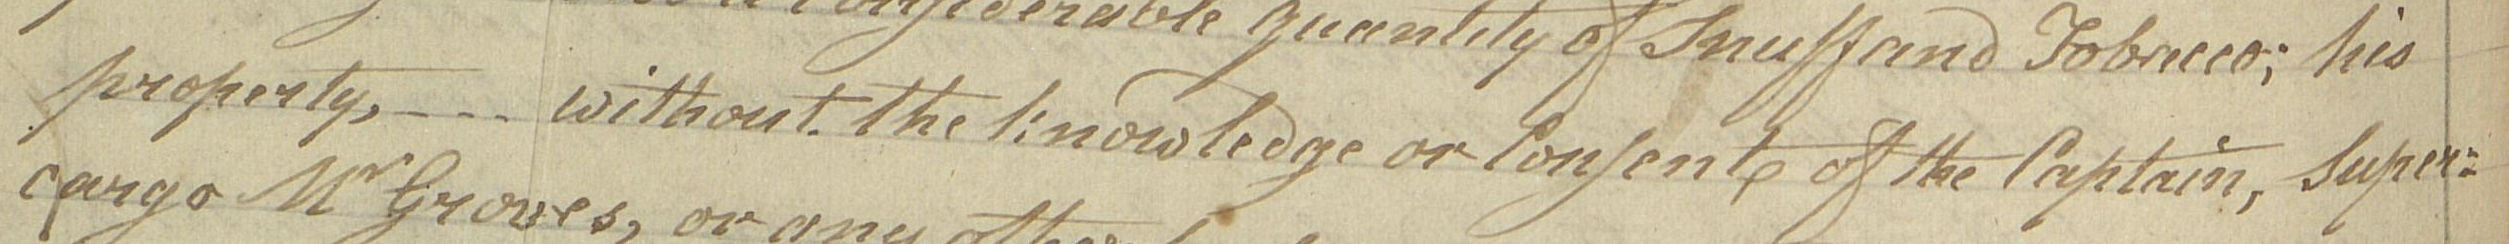property, without the knowledge or Consent of the Captain, Super-
